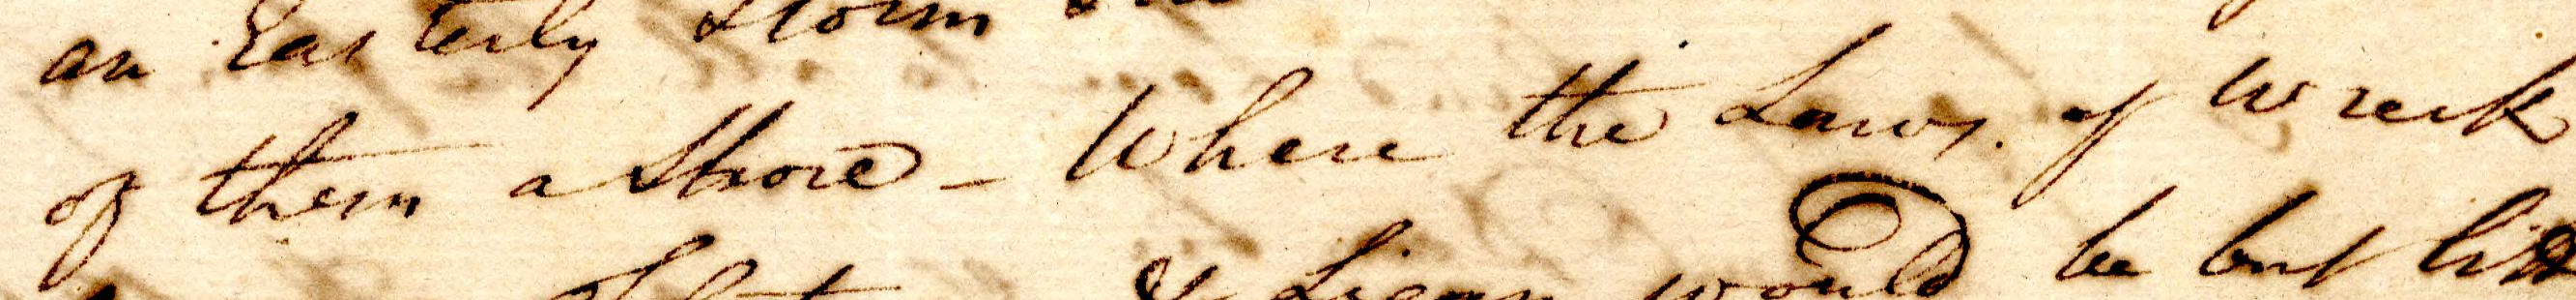of them a Shore- Where the Laws of wreck
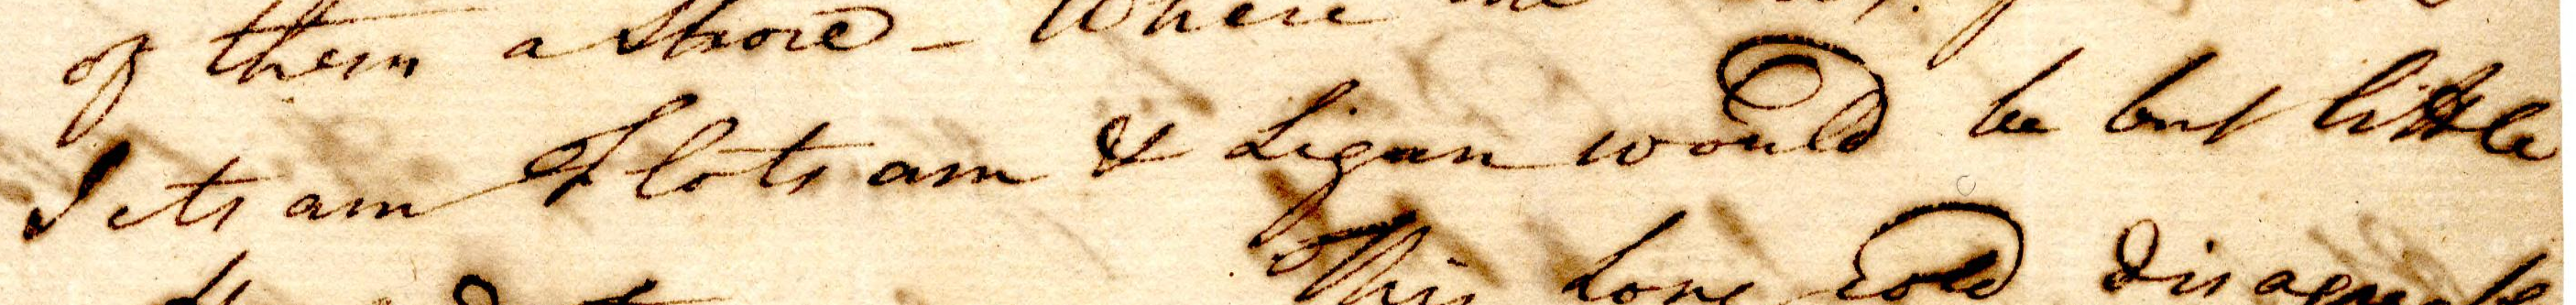Jetsam Flotsam & Ligan would be but little
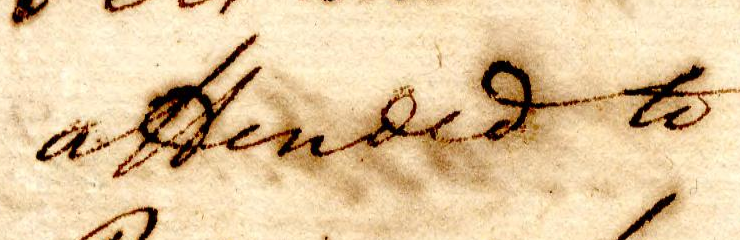attended to
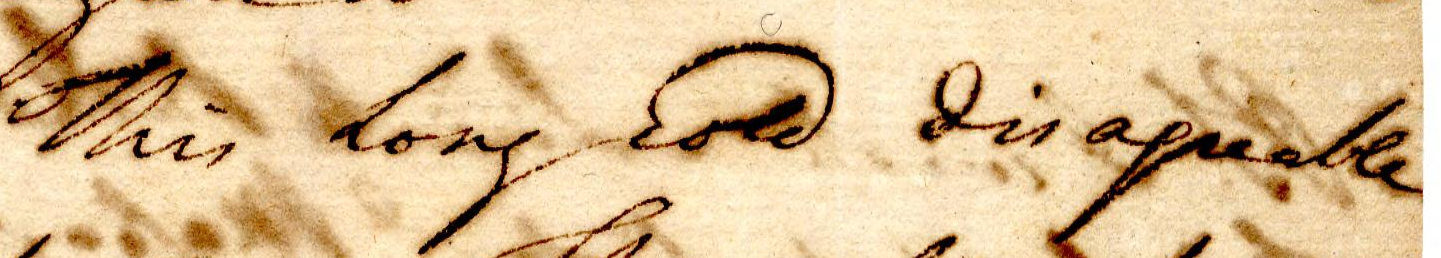This long cold disagreeable
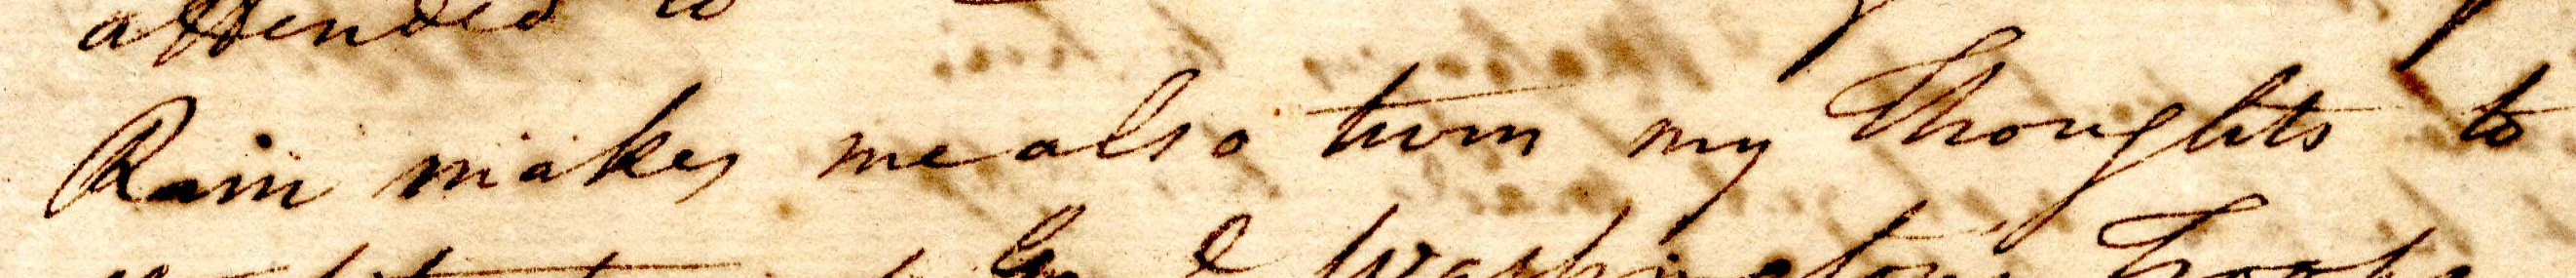Rain makes me also turn my Thoughts to
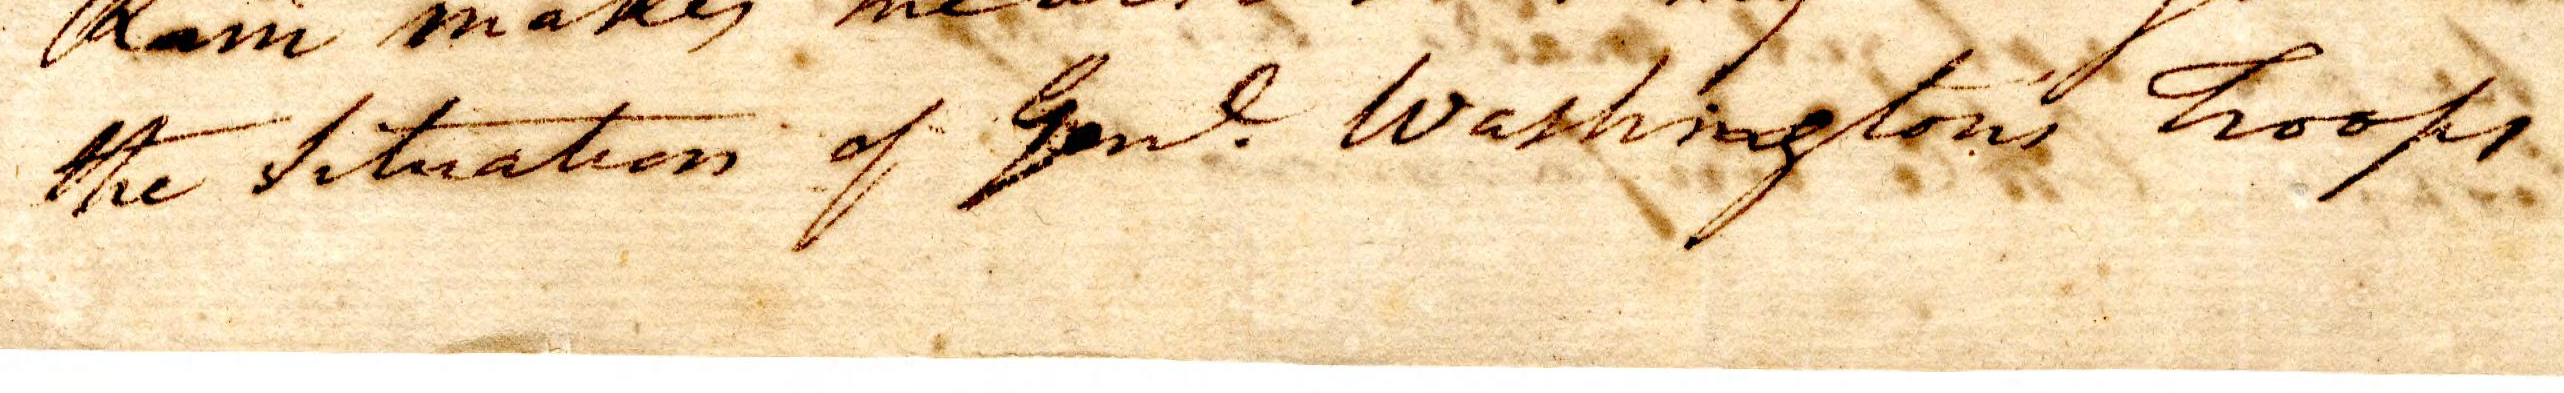the Situation of Gn^l. Washingtons Troops
